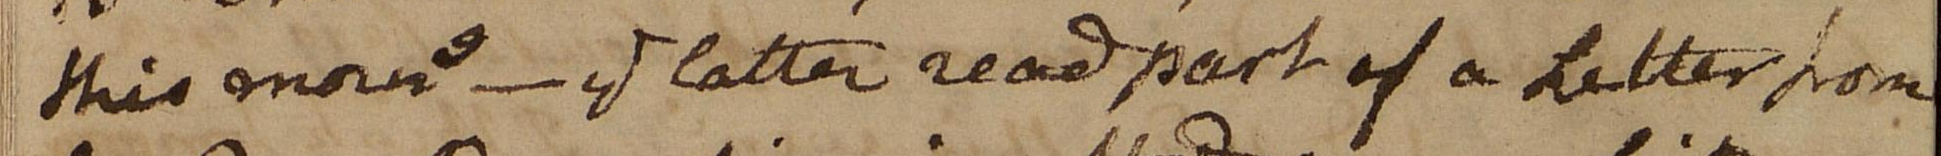this morn^g- y^e latter read part of a Letter from
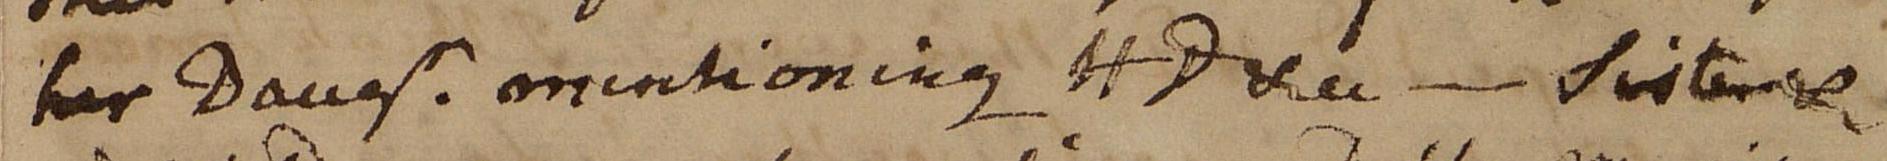her Daug^r. mentioning HD &c- Sister &
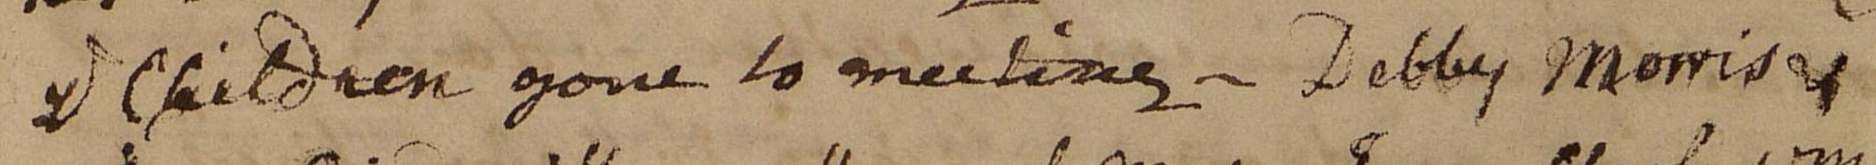y^e Children gone to meeting- Debby Morris &
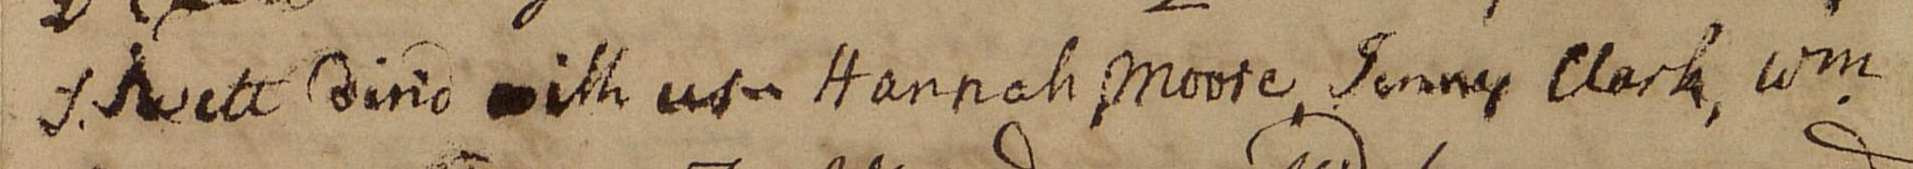S. Swett din'd with us- Hannah Moore, Jenny Clark, W^m.
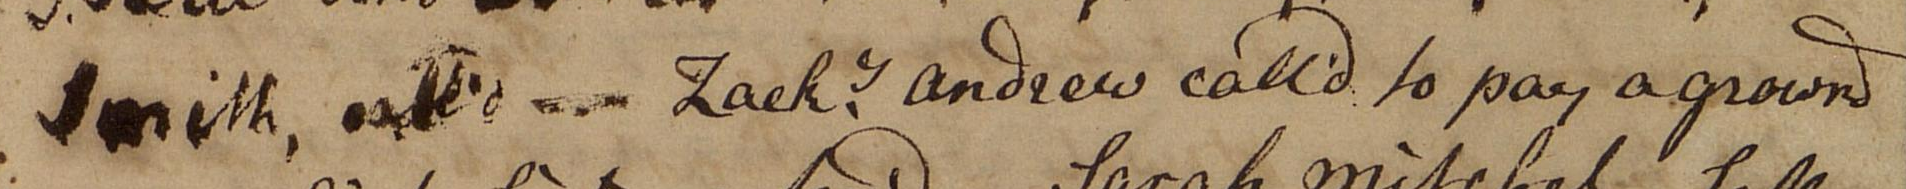Smith, call'd- Zack^y. Andrew call'd to pay a grownd
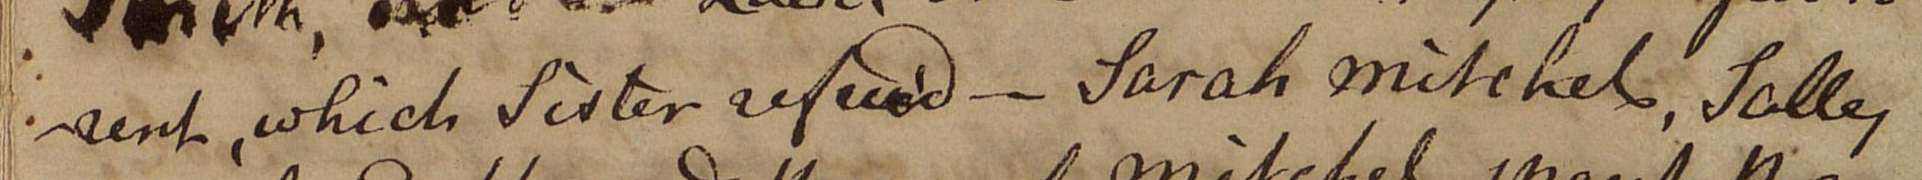-rent which sister refus'd- Sarah Mitchel, Sally
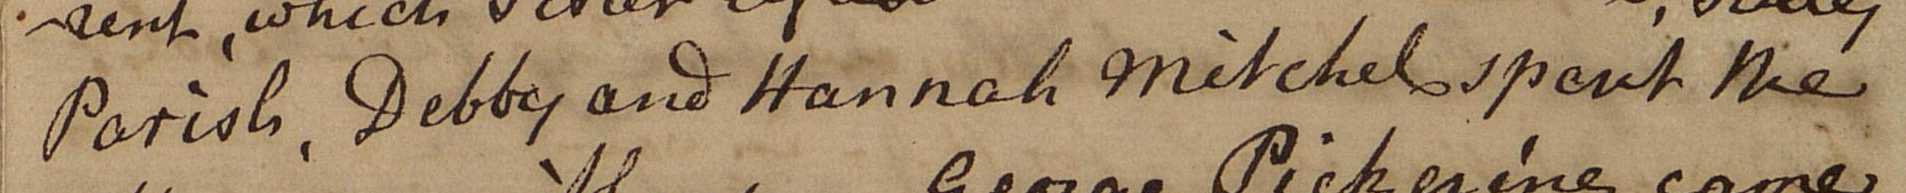Parish, Debby and Hannah Mitchel spent the
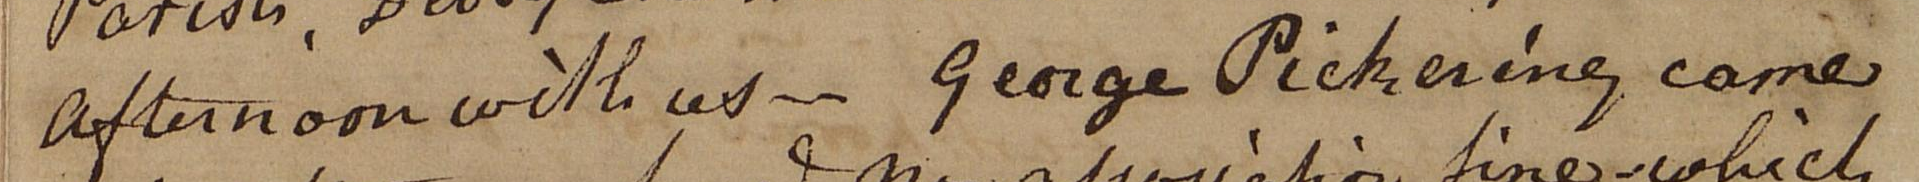afternoon with us- George Pickering came
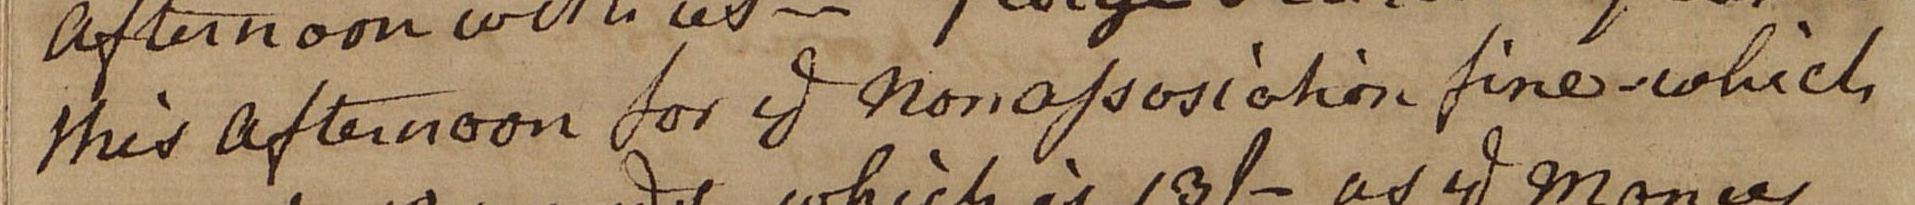this Afternoon for y^e nonassosiation fines-which
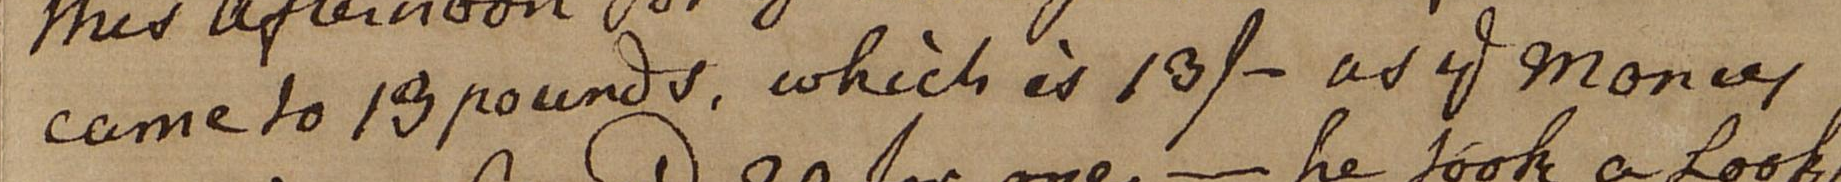came to 13 pounds, which is 13s- as y^e money
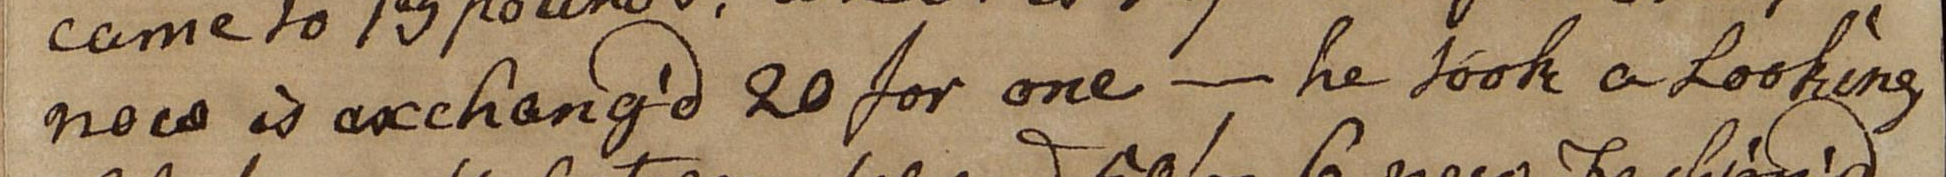now is exchang'd 20 for one- he sook a Looking
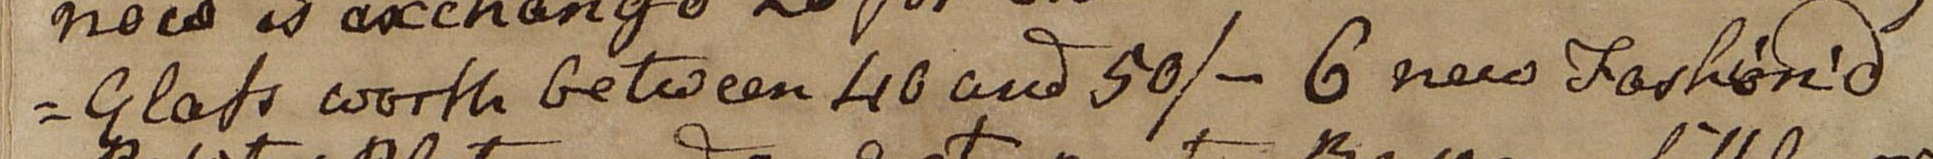-Glats worth between 40 and 50s- 6 new Fashion'd
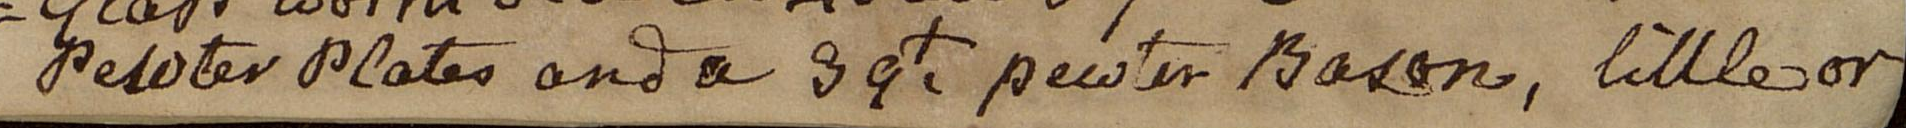Pewter Plates and a 3q^t. pewter Bason, little or
